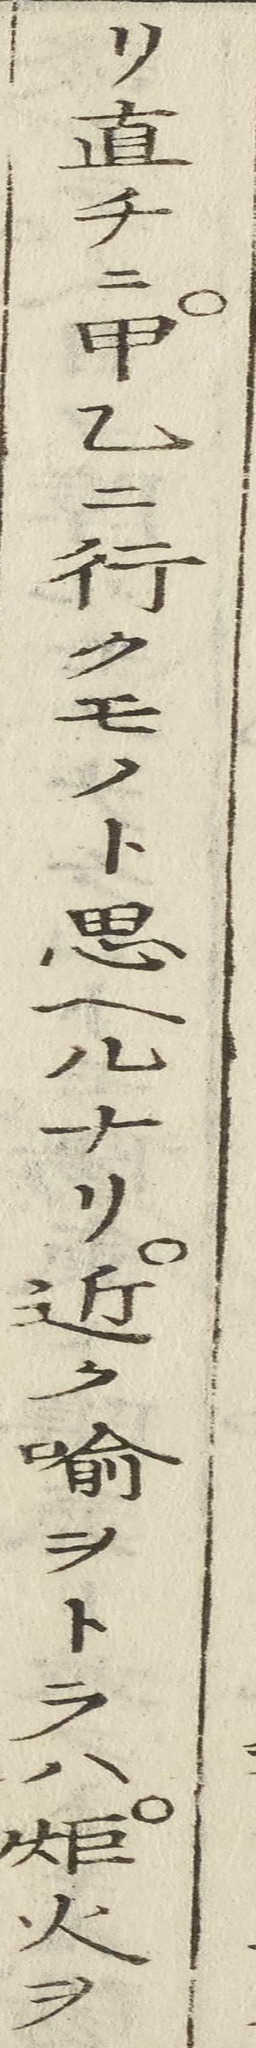リ直チニ。甲乙ニ行クモノト思ヘルナリ。近ク喩ヲトラハ。炬火ヲ
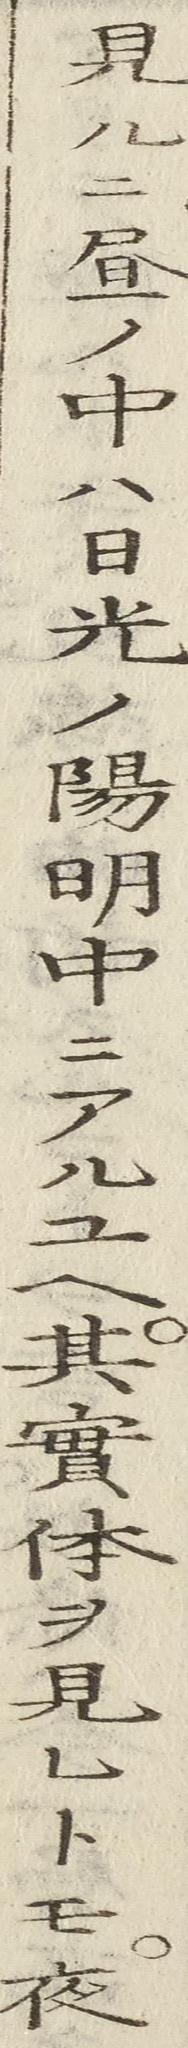見ルニ。昼ノ中ハ日光ノ陽明中ニアルユヘ。其実体ヲ見レトモ。夜
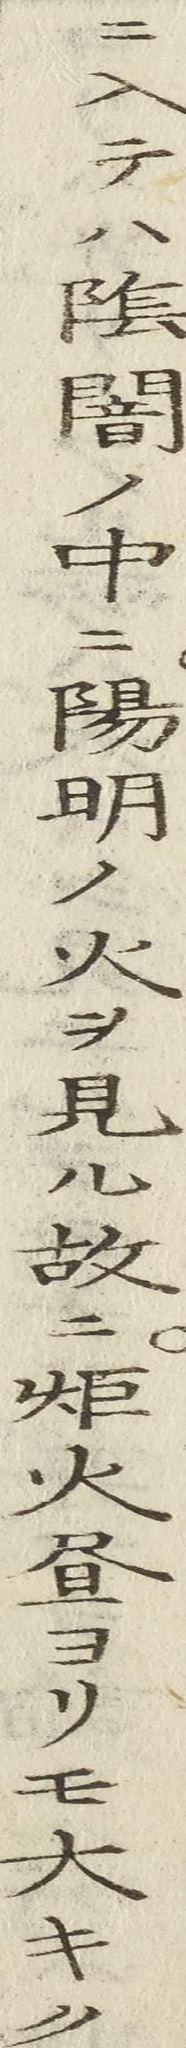ニ入テハ陰闇ノ中ニ陽明ノ火ヲ見ル故ニ。炬火昼ヨリモ大キク
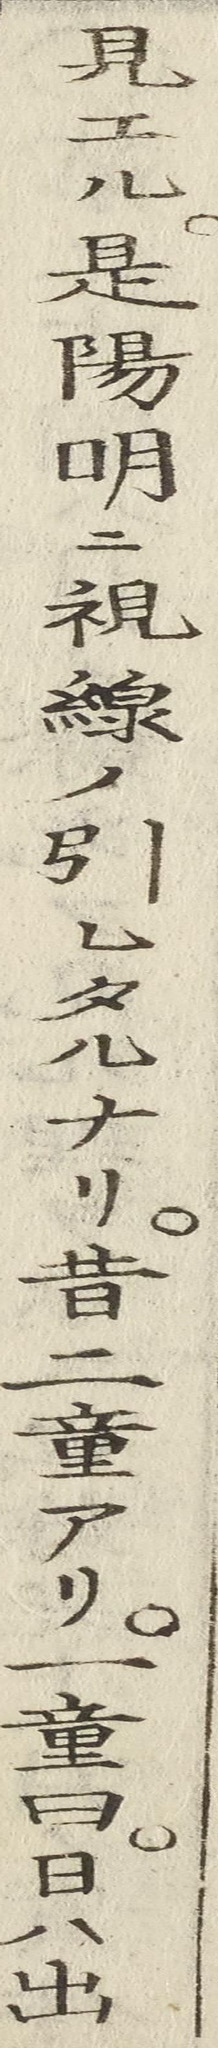見エル。是陽明ニ視線ノ引レタルナリ。昔二童子アリ。一童曰。日ハ出
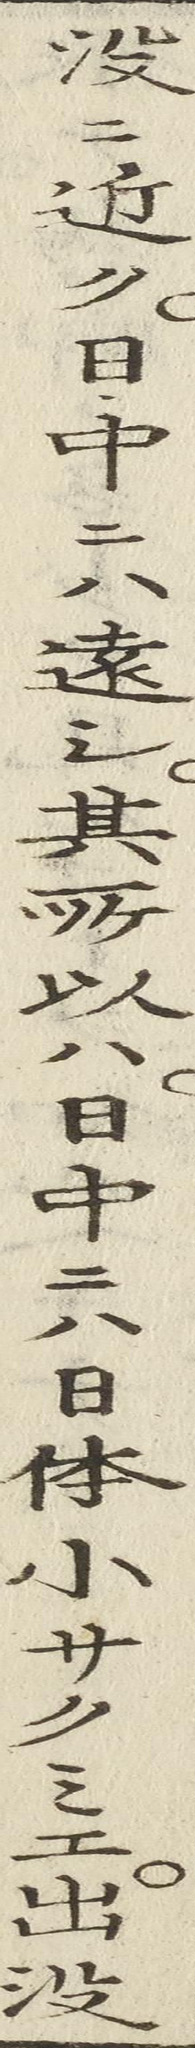没ニ地斯ク。日中ニハ遠シ。其所以ハ。日中ニハ日体小サクミエ。出没
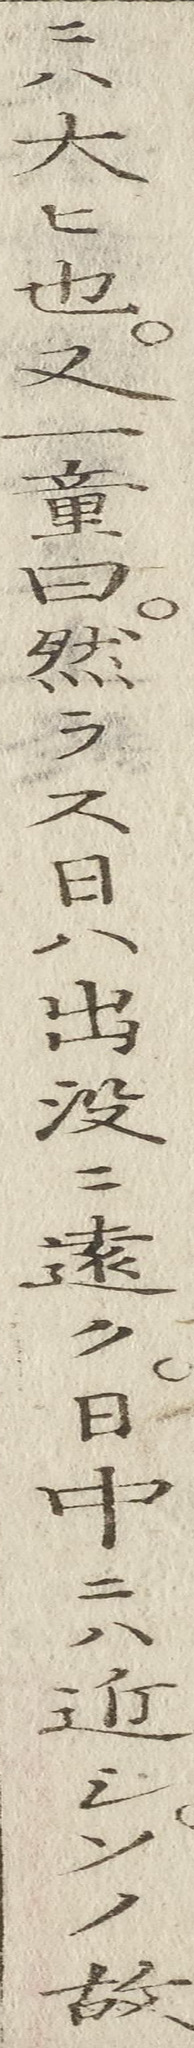ニハ大ヒ也。又一童曰。然ラス日ハ出没ニ遠ク。日中ニハ近シ。ソノ故
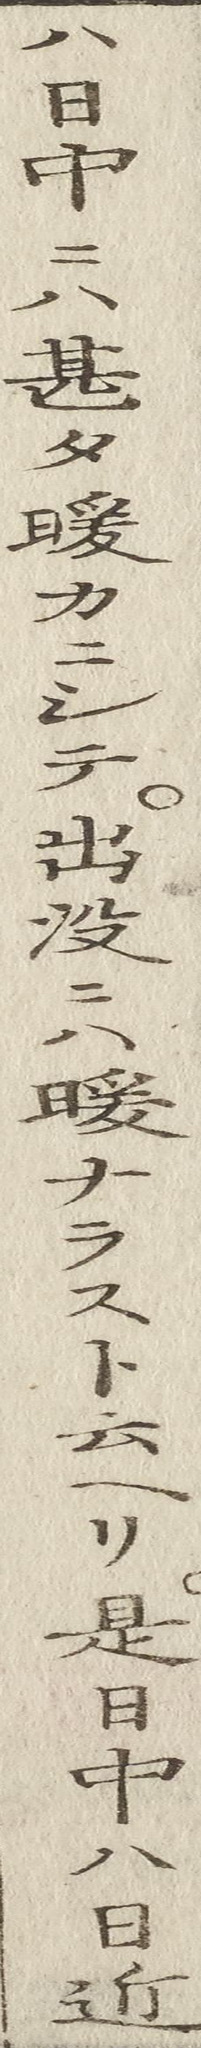ハ日中ニハ甚タ暖カニシテ。出没ニハ暖ナラスト云ヘリ。是日中ハ日近
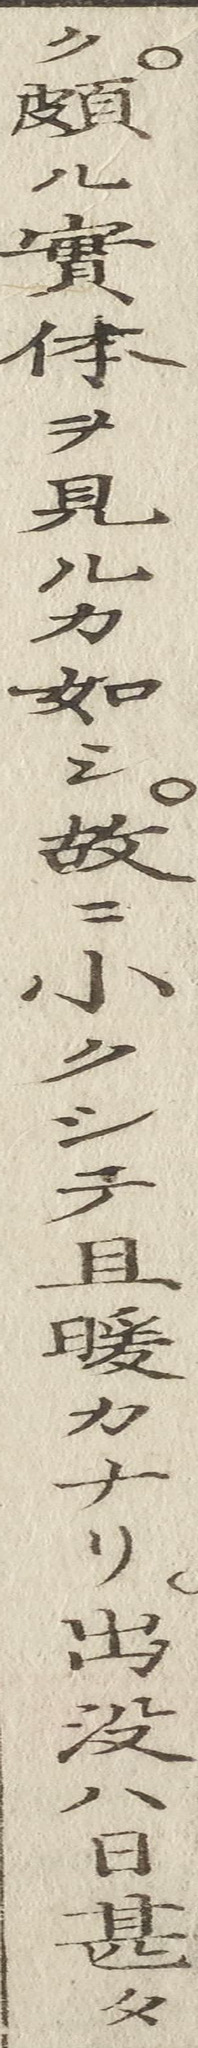ク。頗ル実体ヲ見ルカ如シ。故ニ小クシテ且暖カナリ。出没ハ日甚タ
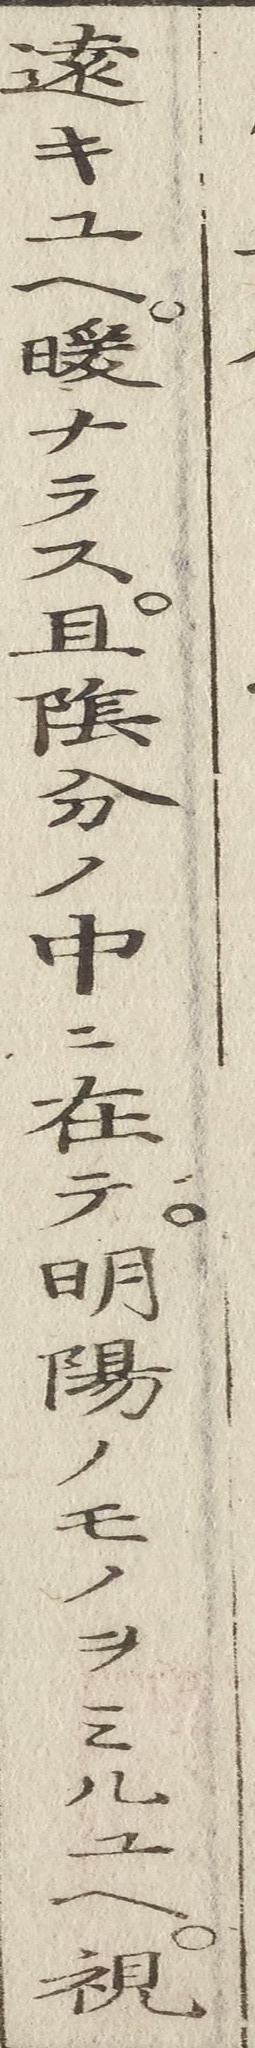遠キユヘ。暖ナラス。且陰分ノ中ニ在テ。明陽ノモノヲミルユヘ。視
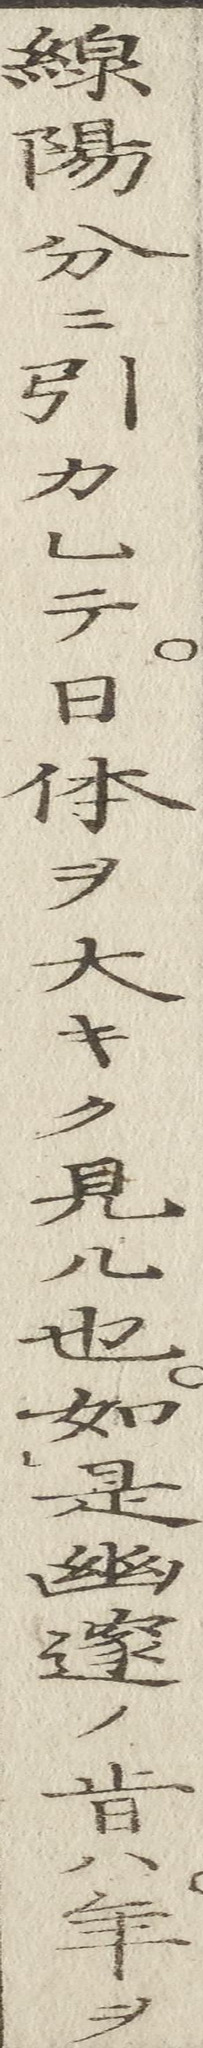線陽分ニ引カレテ。日体ヲ大キク見ル也。如是幽邃ノ旨ハ。年ヲ
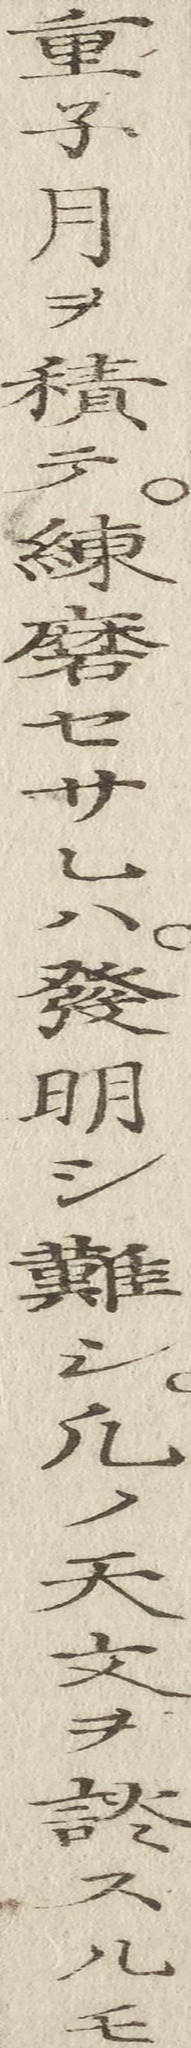重ネ月ヲ積テ。練磨セサレハ。発明シ難シ。凡ノ天文ヲ談スルモ
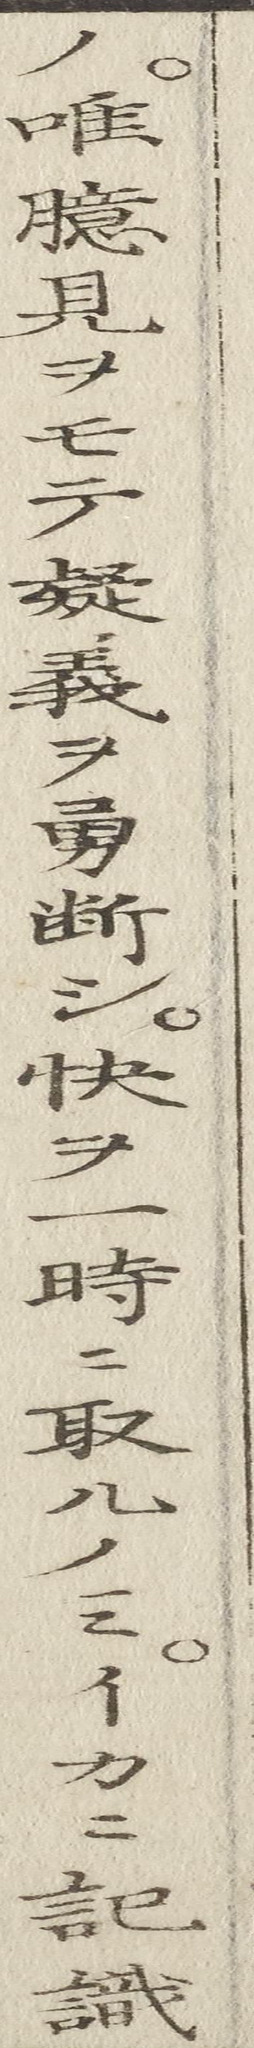ノ。唯臆見ヲモテ疑義ヲ勇断シ。快ヲ一時ニ取ルノミ。イカニ記識
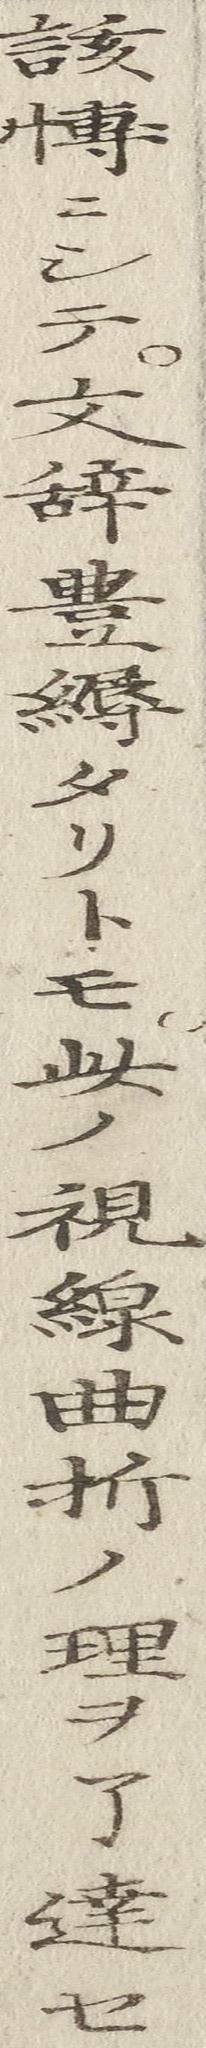該博ニシテ。文辞豊縟タリトモ。此ノ視線曲折ノ理ヲ了達セ
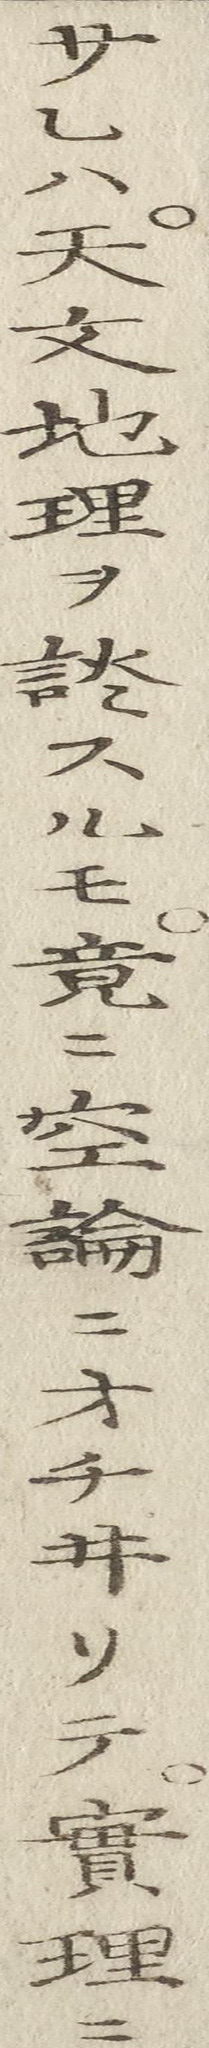サレハ。天文地理ヲ談スルモ。竟ニ空論ニオチヰリテ。実理ニ
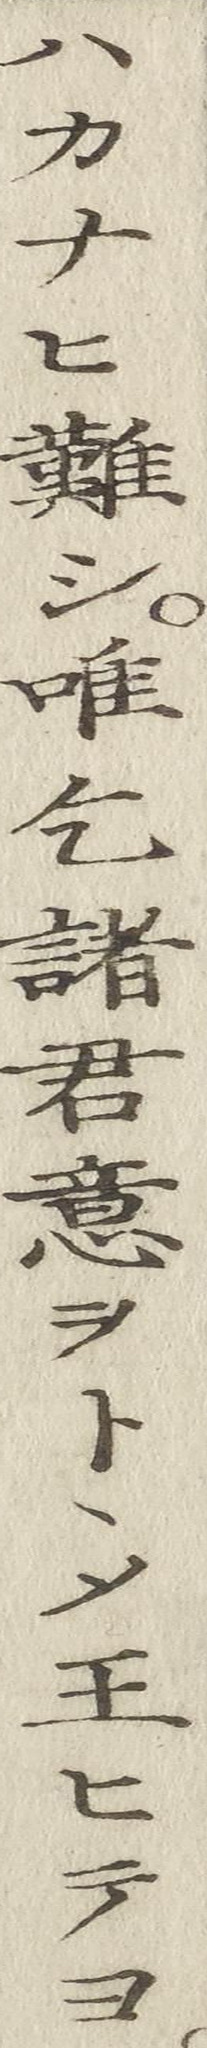ハカナヒ難シ。唯乞諸君意ヲトヽメ玉ヒテヨ。

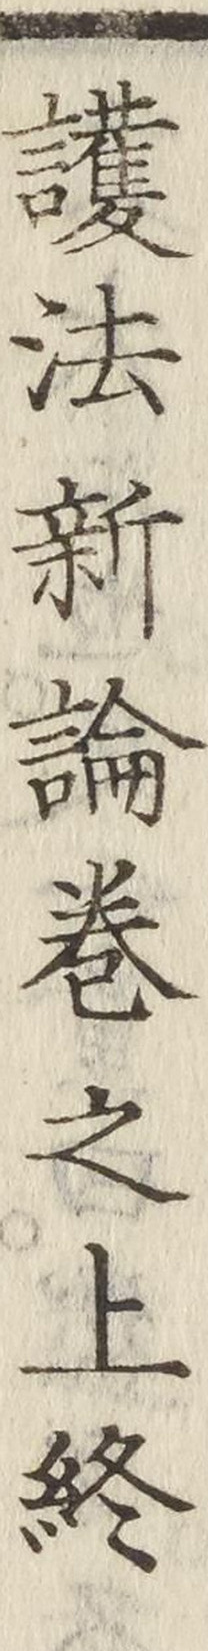護法新論巻之上終
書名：護法新論　上
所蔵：東京大学地震研究所図書室 Earthquake Research Institute Library, The University of Tokyo, JAPAN
